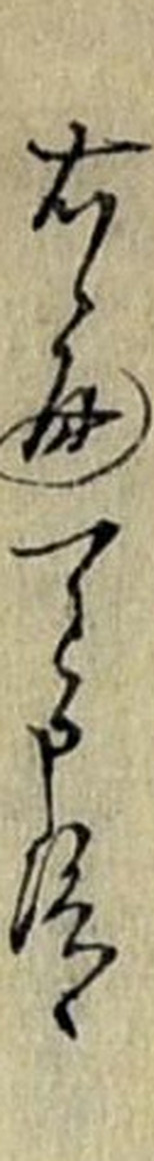右之通可被申従候
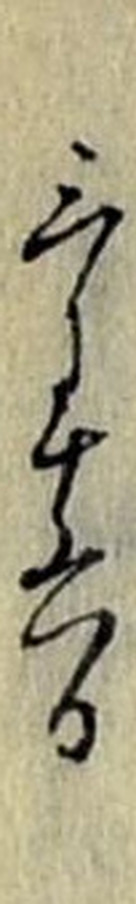三月十六日
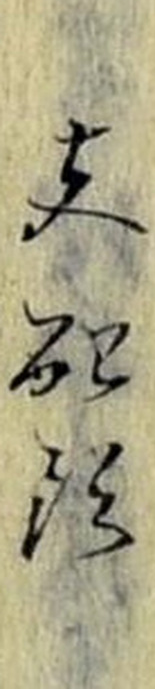支配頭
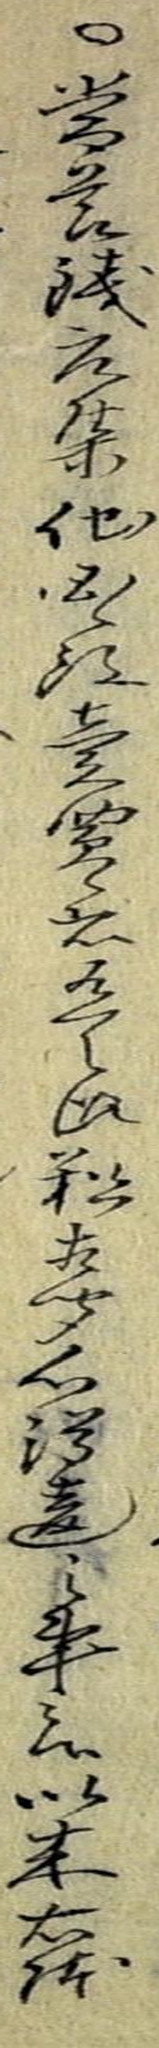○当節銭取集他国へ致売買者有之趣粗相聞心得違之事ニ候以来右体
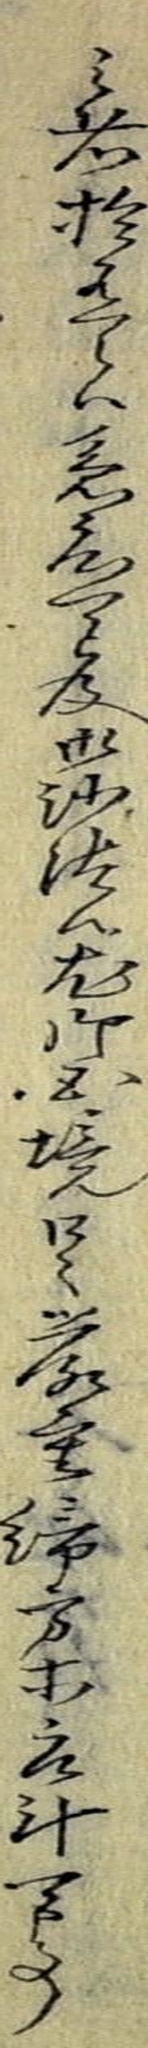之者於有之ハ急度可被及御沙汰候尤御国境口々厳重締方等取計可申事
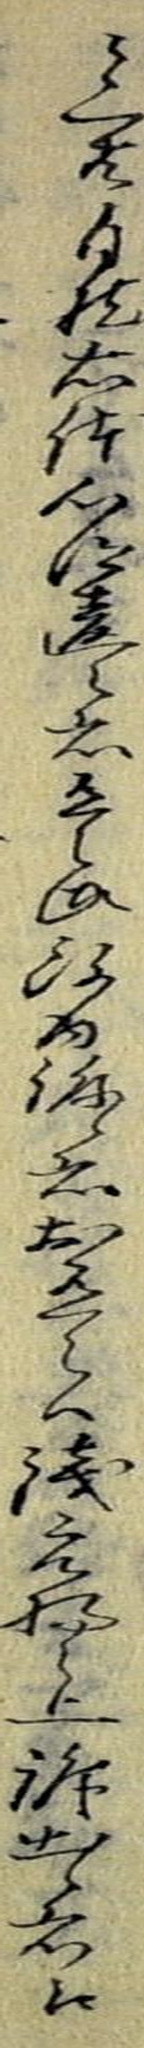ニ候へ共自然右体心得違之者有之趣致内訴候者於有之ハ銭元持之上訴出候者江
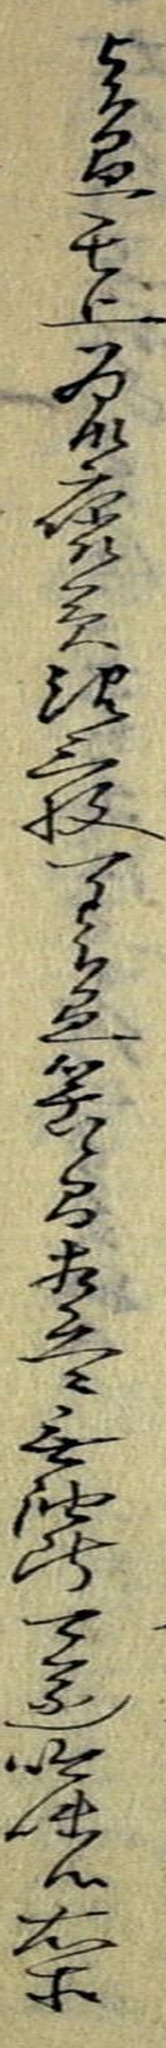被下置其上為御褒美銀三枚可被下置筈候間相在々無油断可遂吟味右等
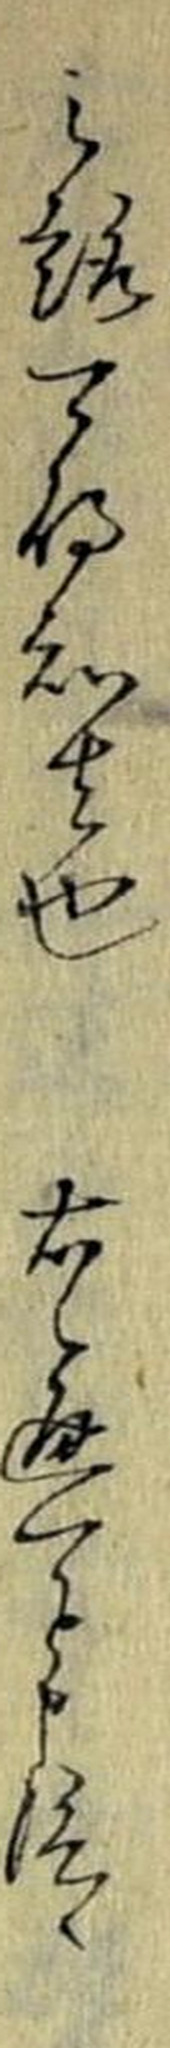之趣可得知者成右之通可被申従候
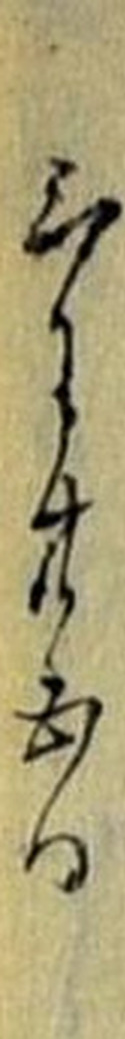三月十六日
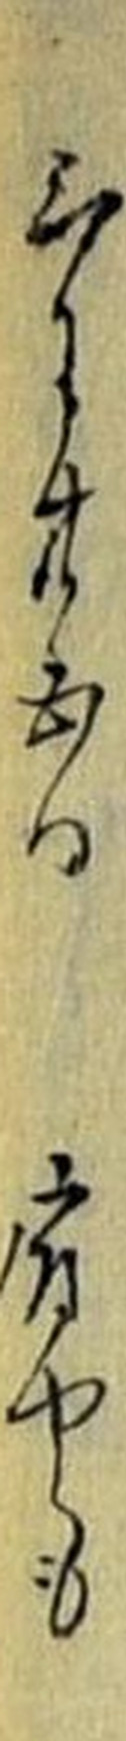三月廿五日府中へも
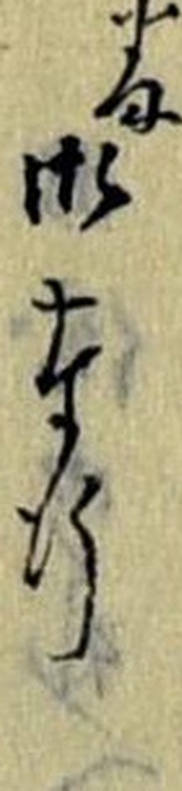御奉行
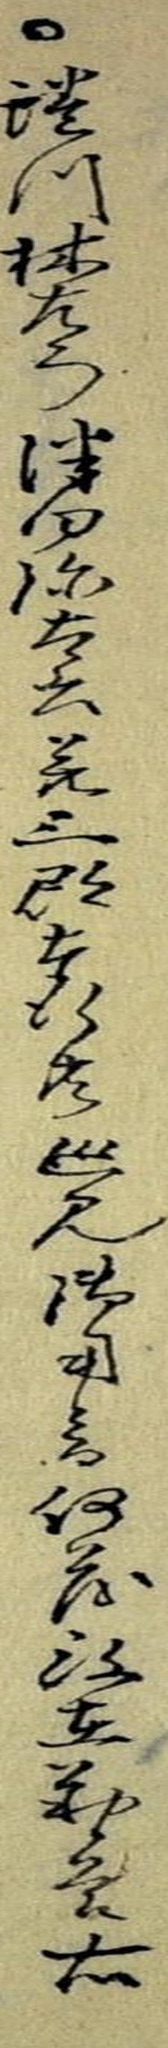○蜷川林左衛門津田弥太六并三郡奉行共巡見御用ニ而何茂致在勤候節右
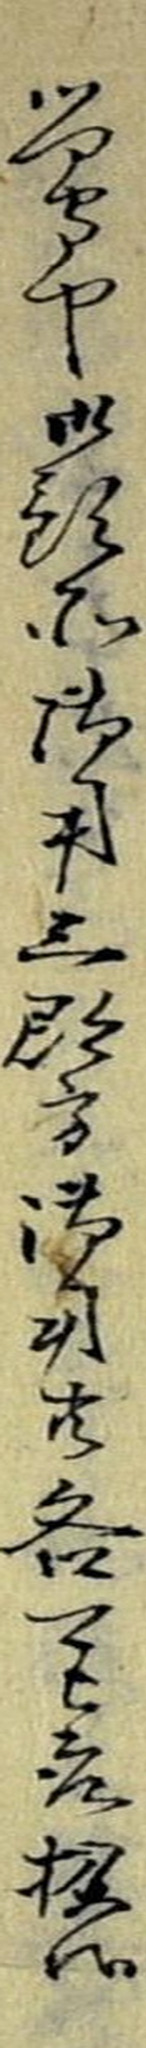留守中御預所御用三郡方御用共各可被取扱候
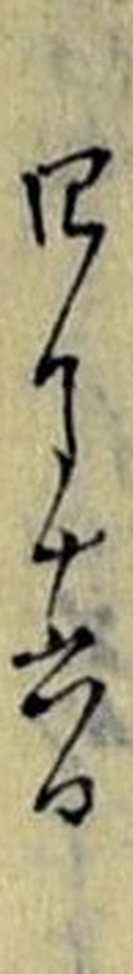四月十六日
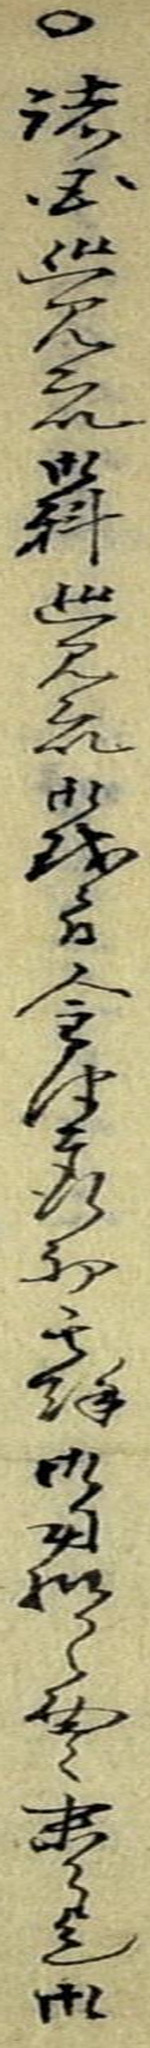○諸国巡見衆御料巡見衆御越ニ付金津奉行初其余御用掛り之面々末々迄御
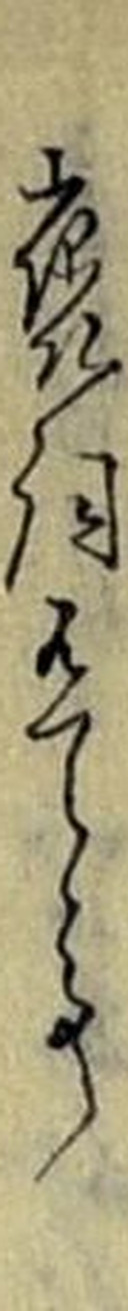褒調有之事
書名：命令之部 五
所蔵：福井県文書館 Fukui Prefectural Archives
